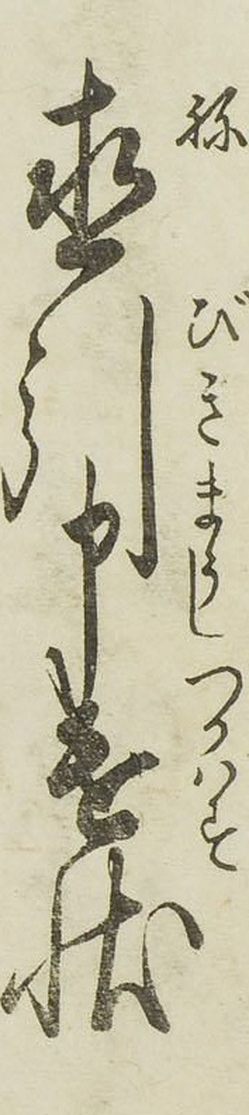直引申遣状
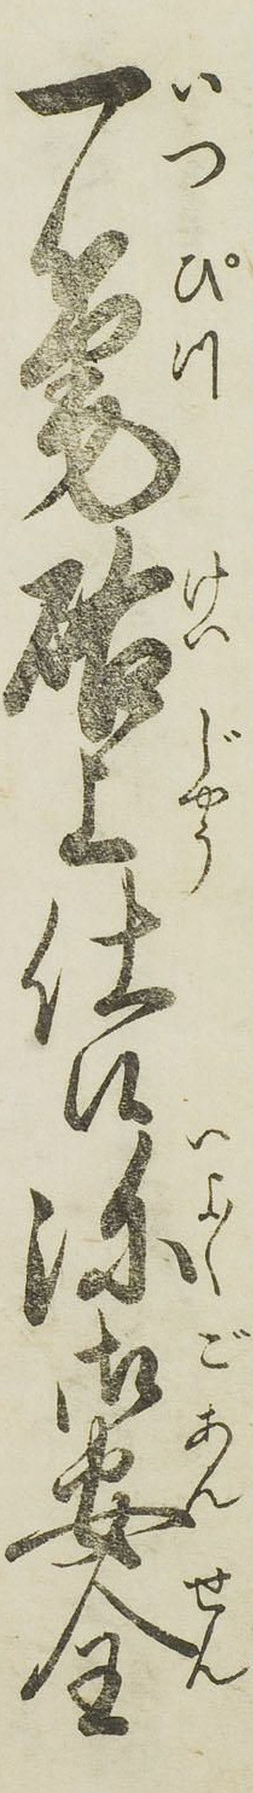一筆啓上仕候弥御安全
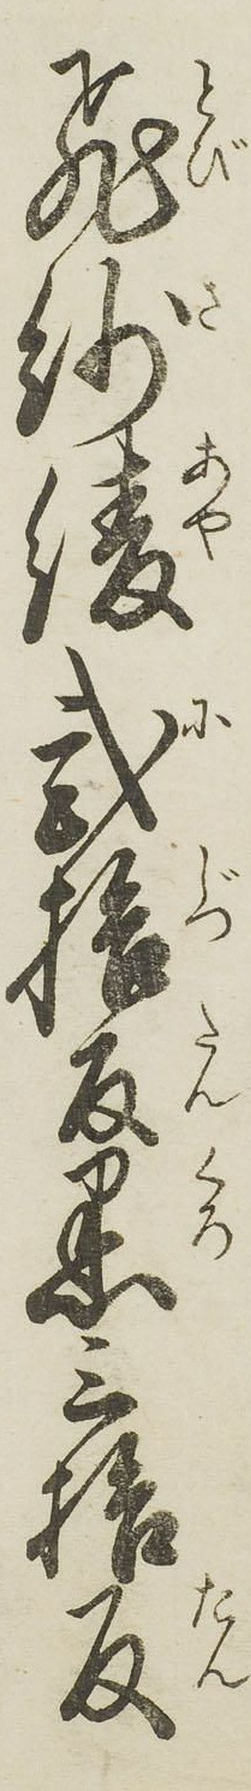飛沙綾弐拾反黒三拾反
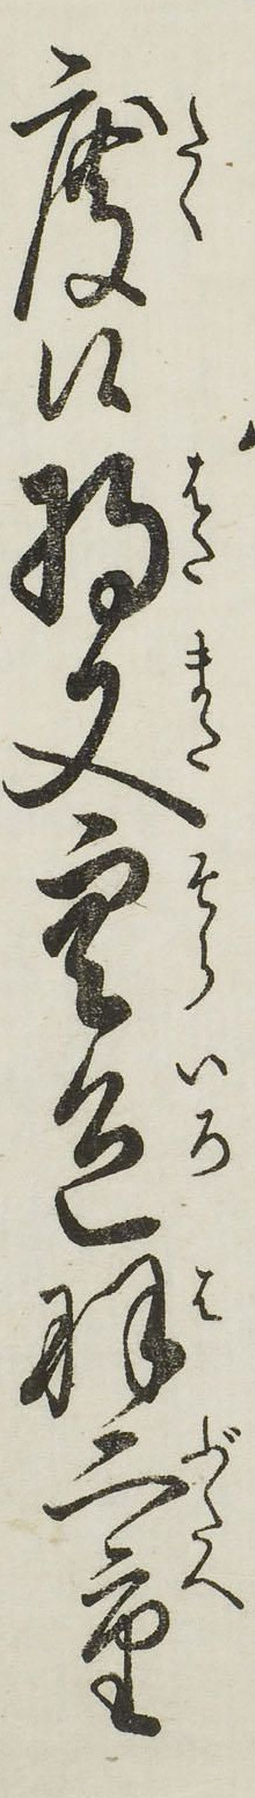度候将又空色羽二重
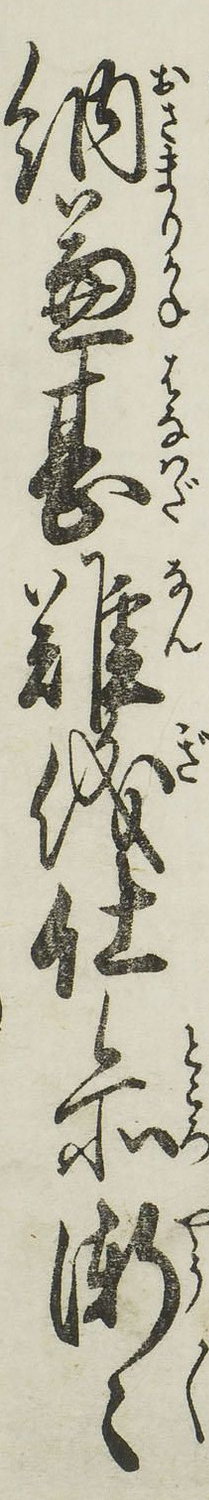納兼甚難儀仕候所漸々

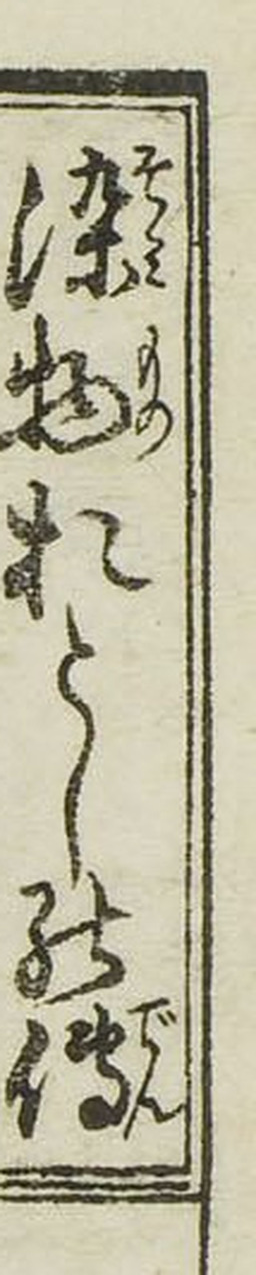染物おとしの伝
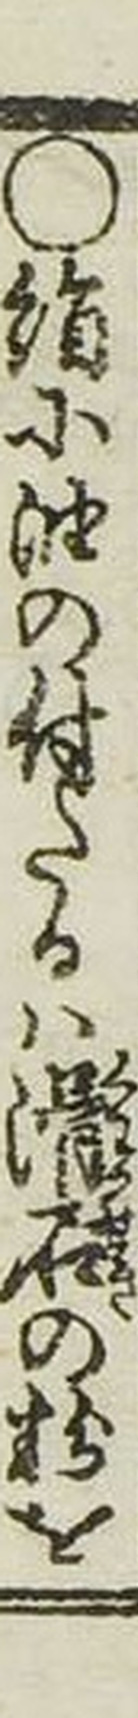〇絹に油の付たるは滑石の粉を
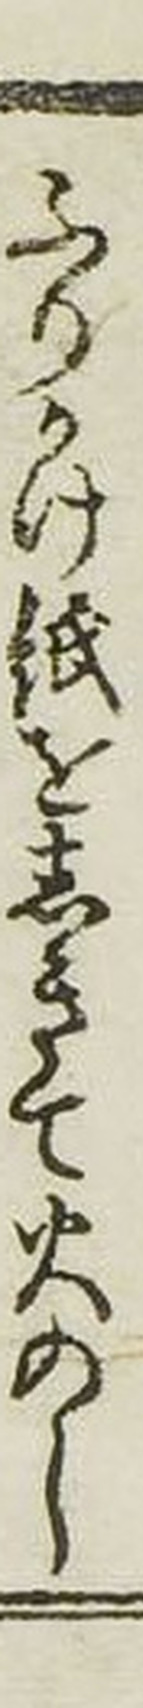ふりかけ紙をしきて火のし
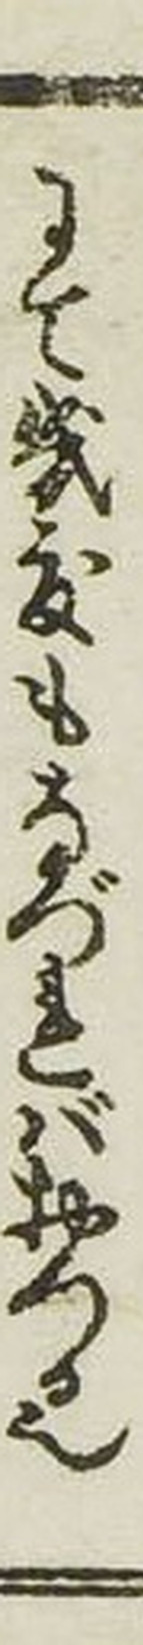にて幾度もなづればおつる也
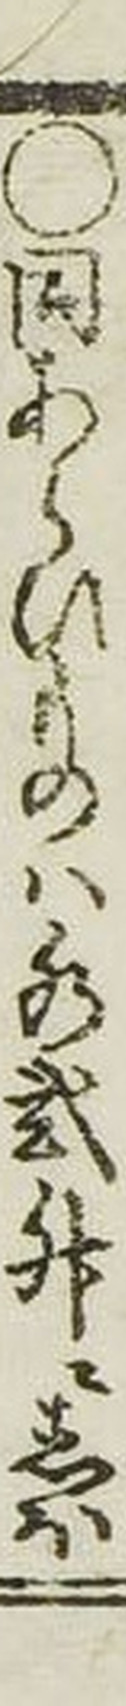〇同あらひものは水弐升にしほ
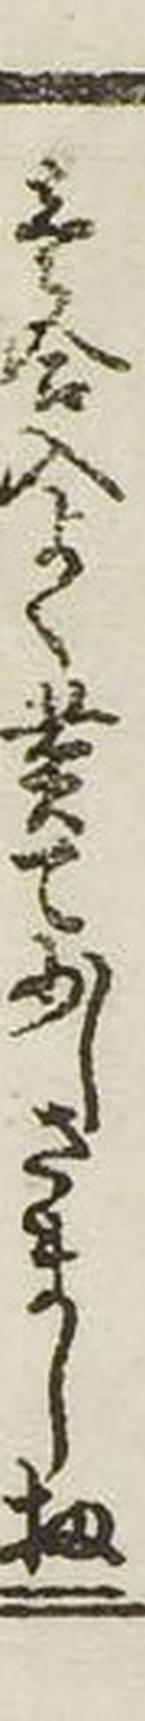壱合入よく煎て少しさまし扨
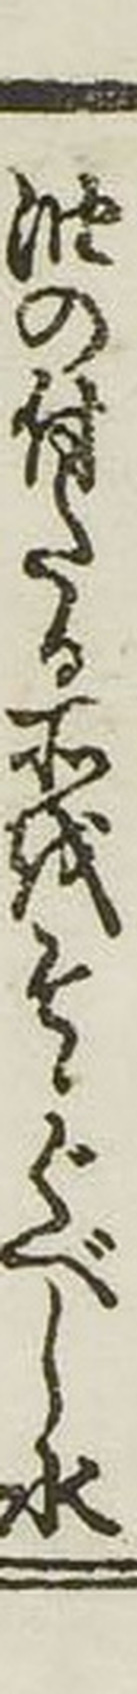油の付たる所をそゝぐべし水
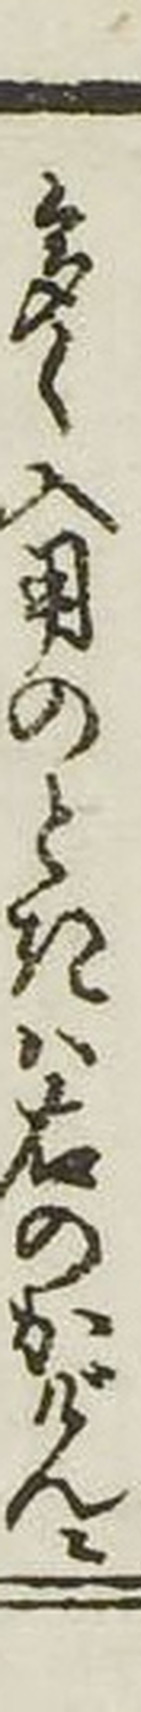多く入用のときは右のかげんに
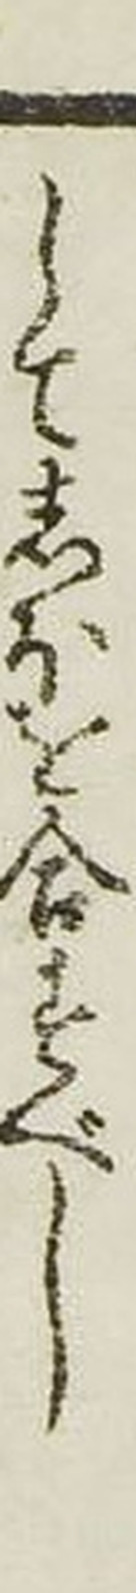してしほをを合すべし
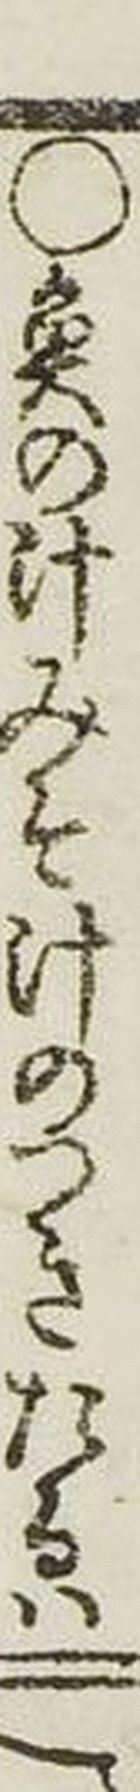〇魚の汁みそ汁のつきたるは
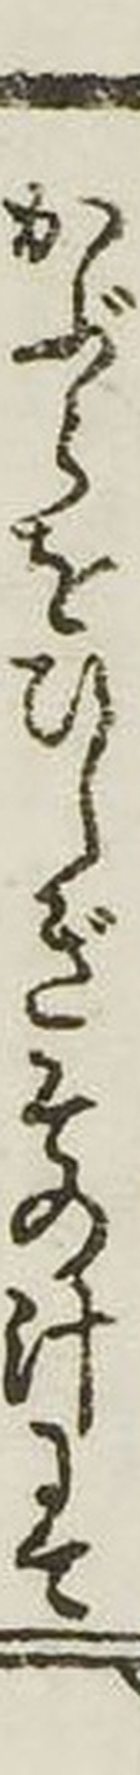かぶらをひしぎその汁にて
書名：商人書翰便覧
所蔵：東京学芸大学教育コンテンツアーカイブ
